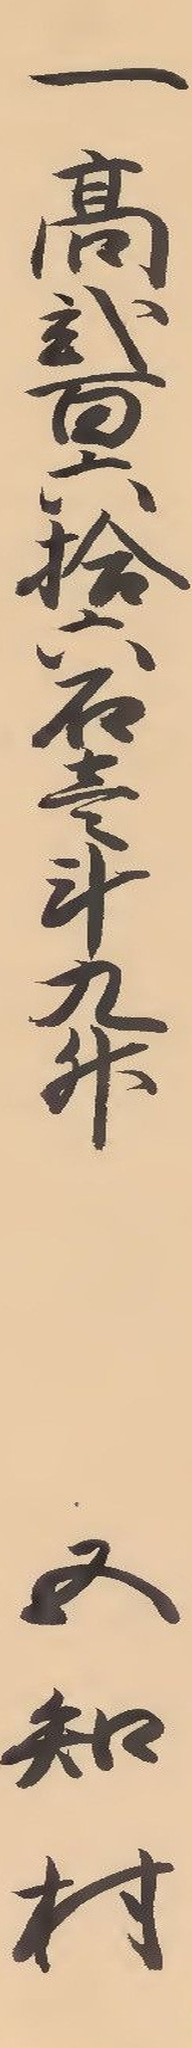一高弐百六拾六石壱斗九升五知村
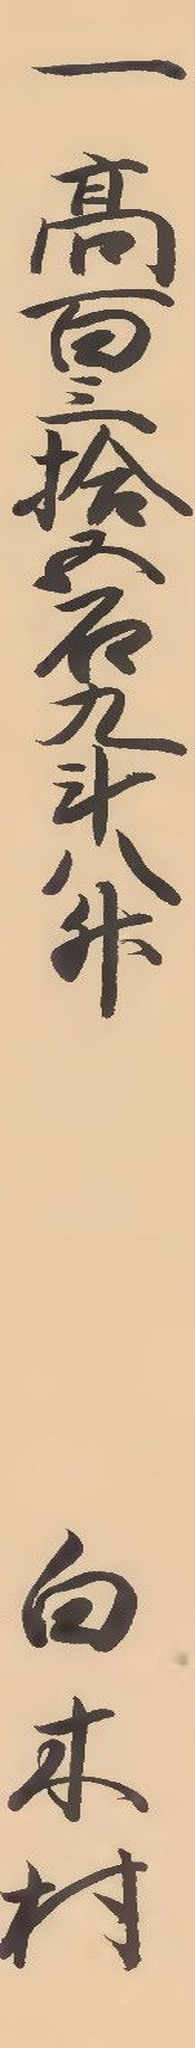一高百三拾五石九斗八升白木村
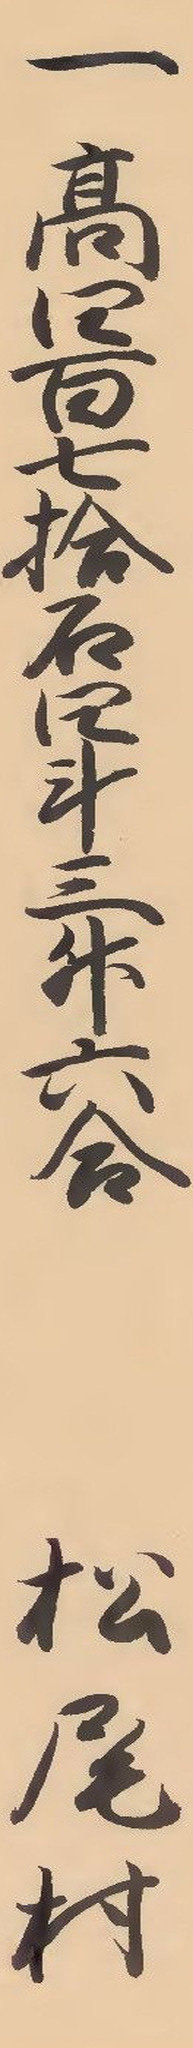一高四百七拾石四斗三升六合松尾村

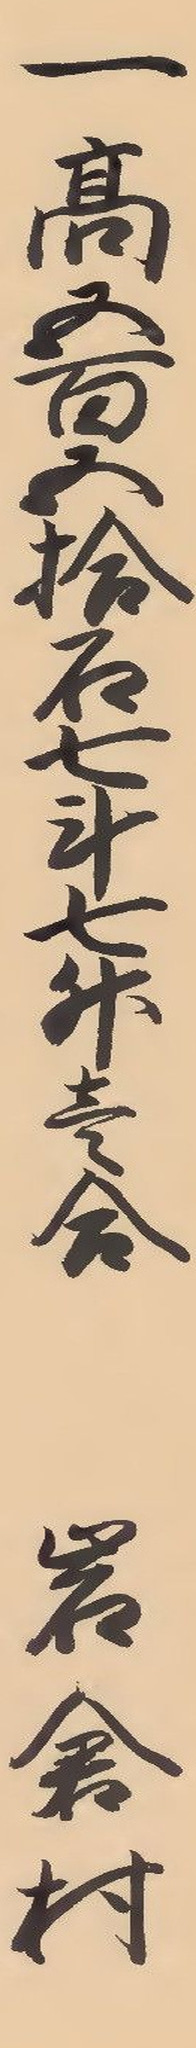一高五百五拾石七斗七升壱合岩倉村
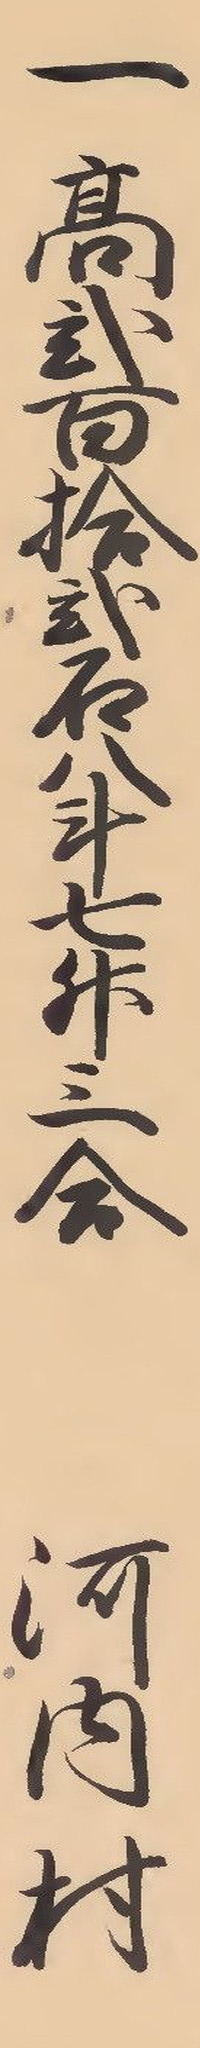一高弐百拾弐石八斗七升三合河内村
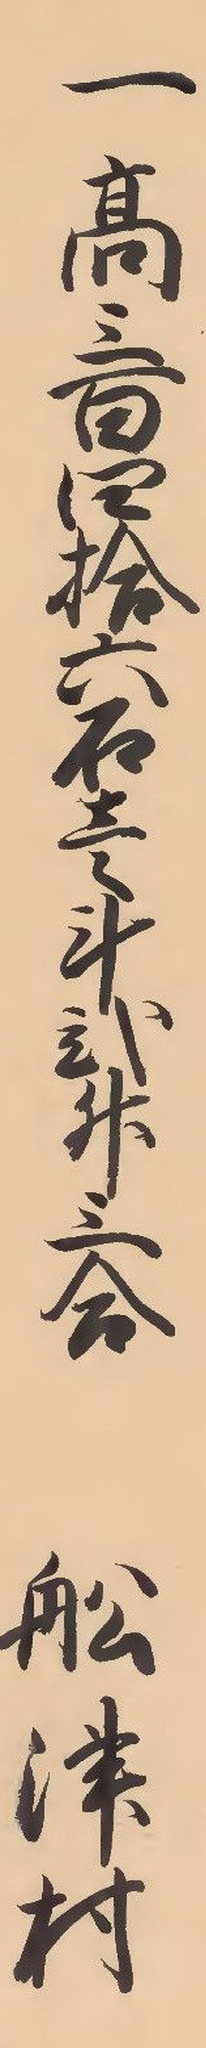一高三百四拾六石壱斗弐升三合船津村
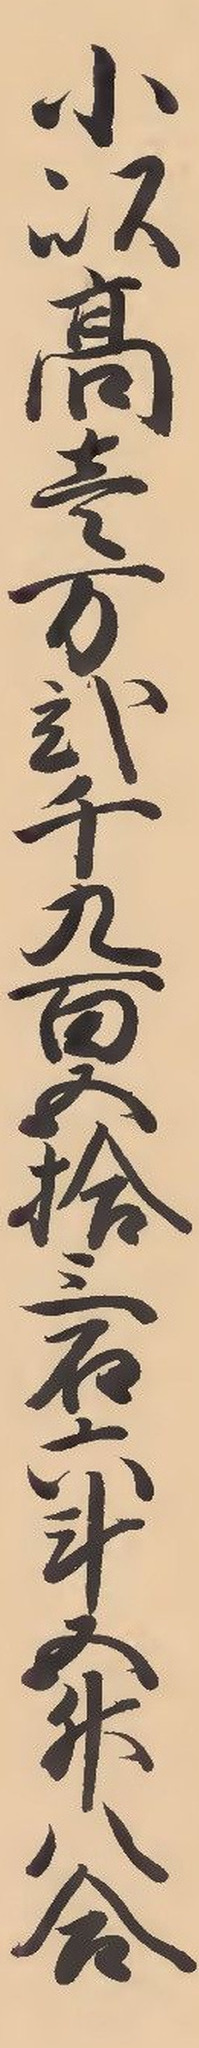小以高壱万弐千九百五拾三石六斗五升八合

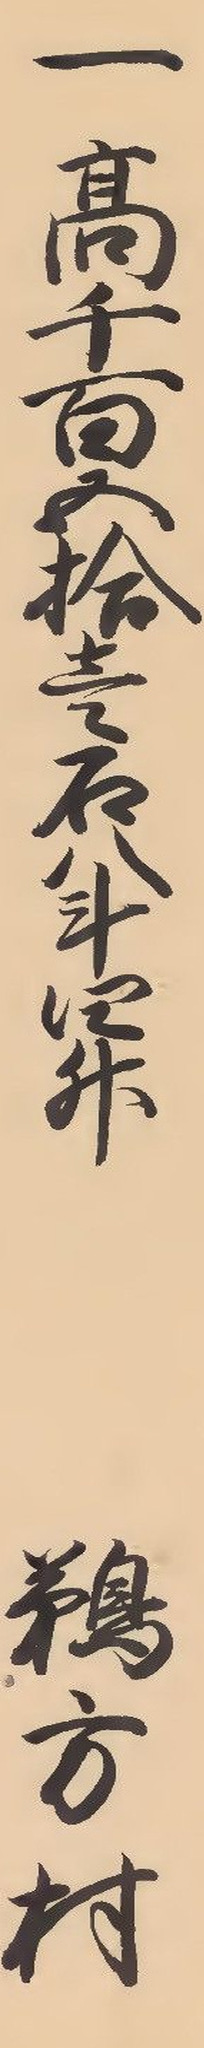一高千百五拾壱石八斗四升鵜方村
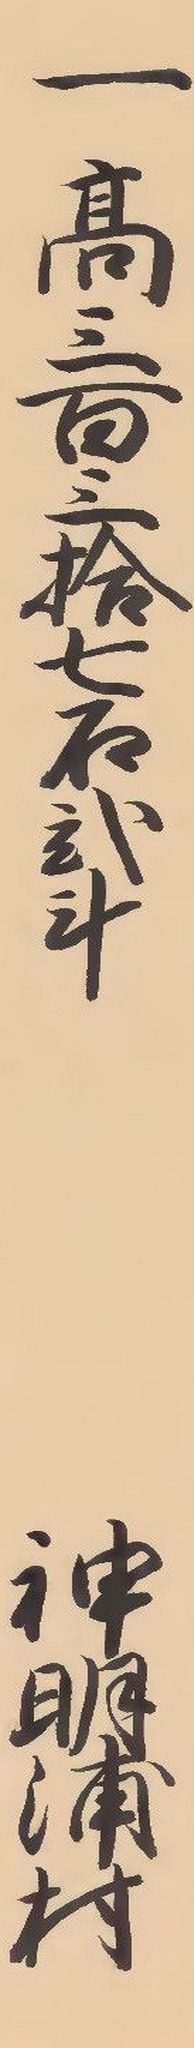一高三百三拾七石弐斗神明浦村
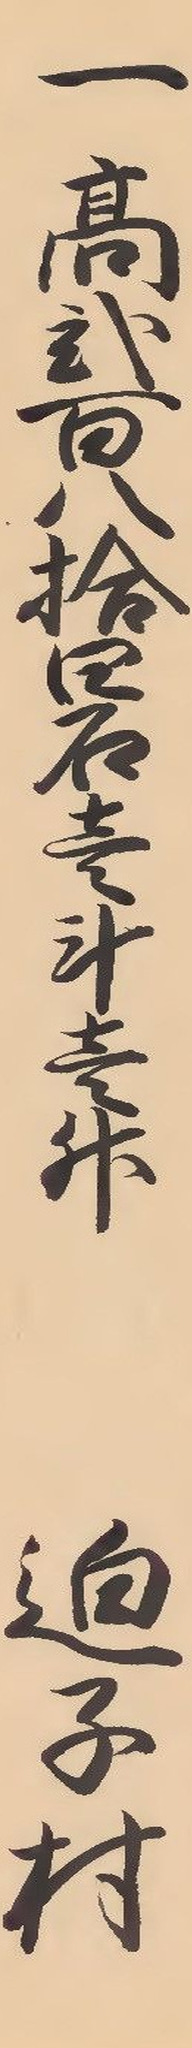一高弐百八拾四石壱斗壱升迫子村
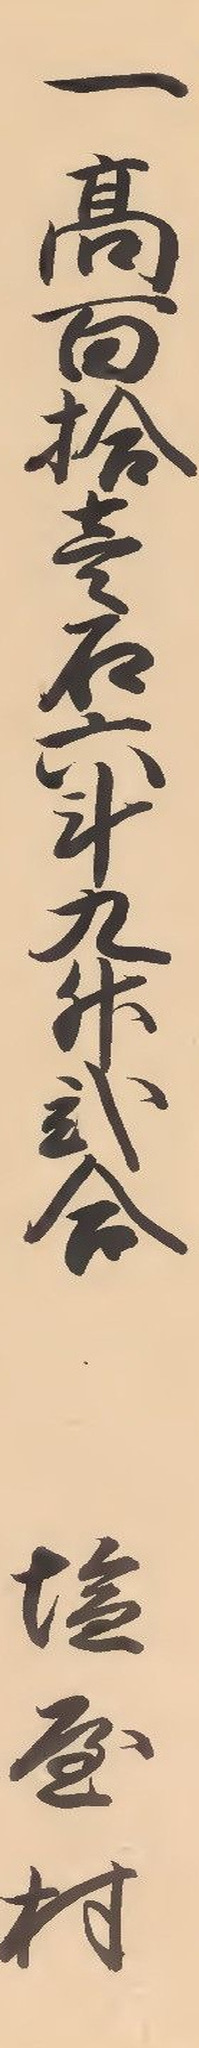一高百拾壱石六斗九升弐合塩屋村
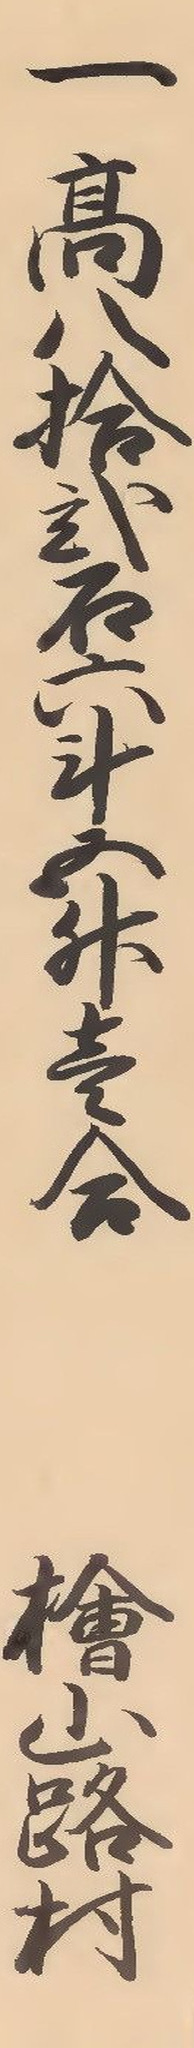一高八拾弐石六斗五升壱合檜山路村
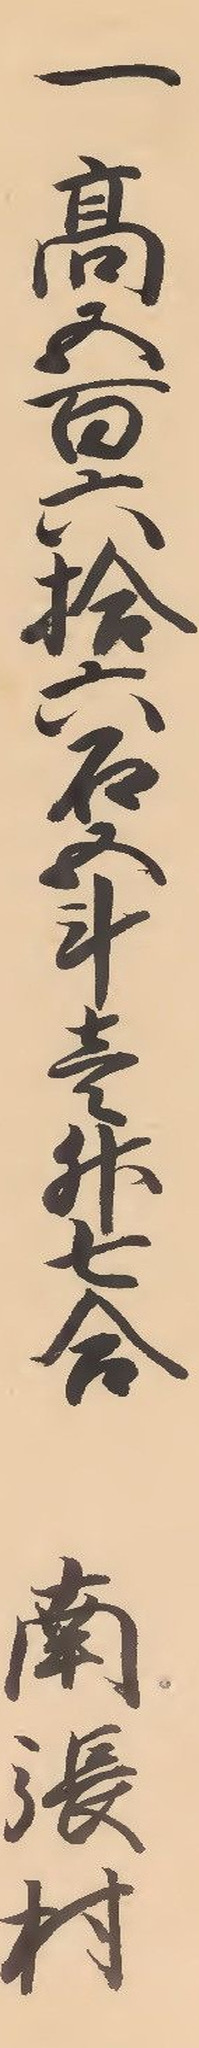一高五百六拾六石五斗壱升七合南張村
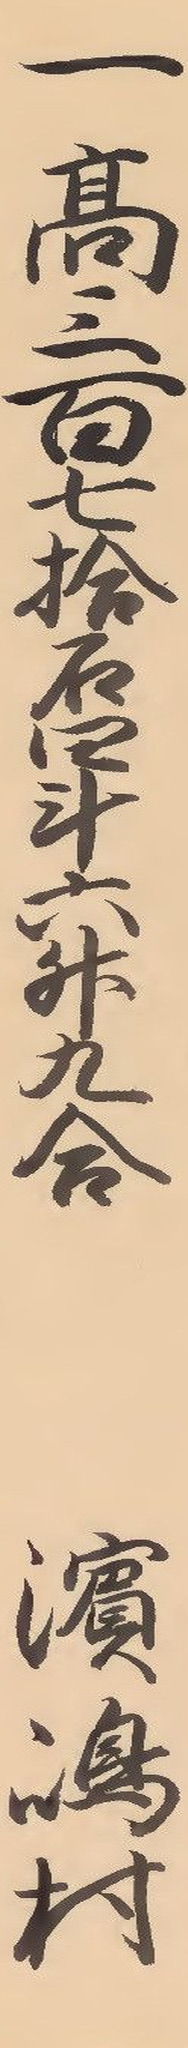一高三百七拾石四斗六升九合浜島村

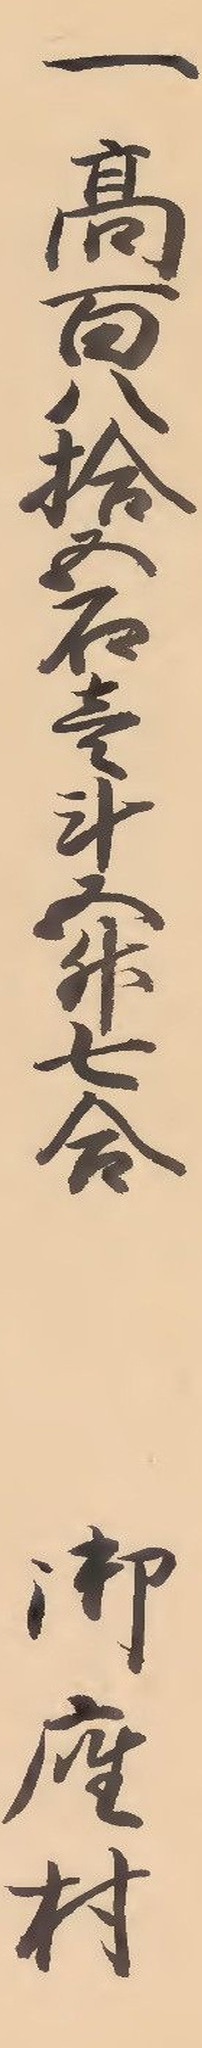一高百八拾五石壱斗五升七合御座村
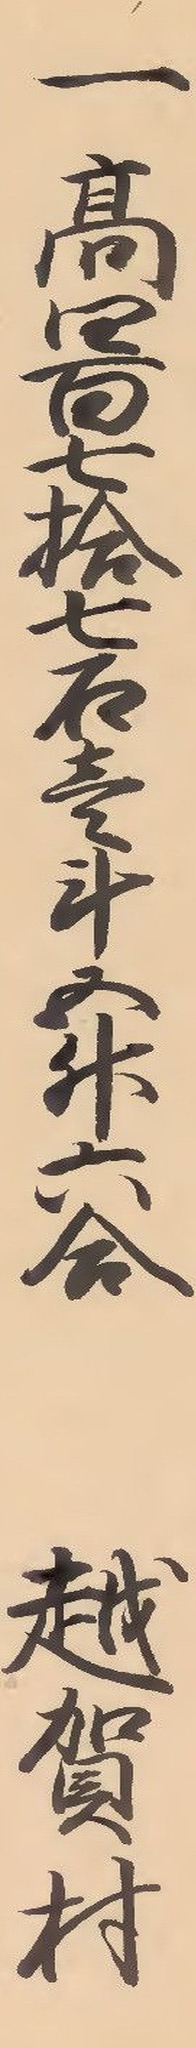一高四百七拾七石壱斗五升六合越賀村
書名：志摩国郷帳
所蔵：国立公文書館 National Archives of Japan
